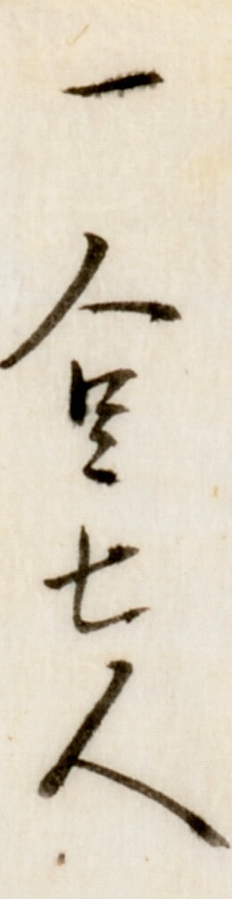一人足七人
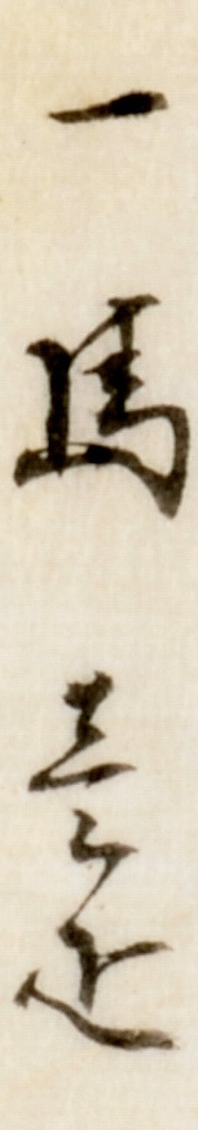一馬壱疋
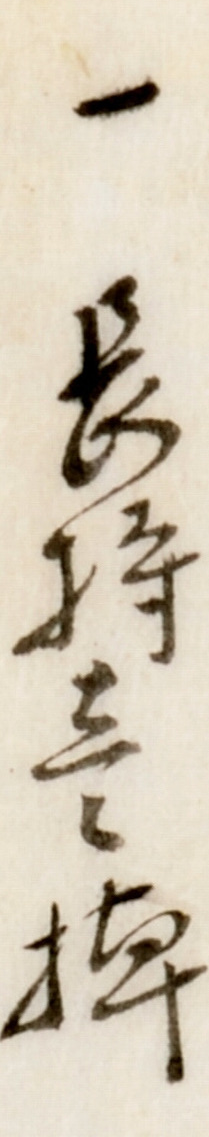一長持壱棹
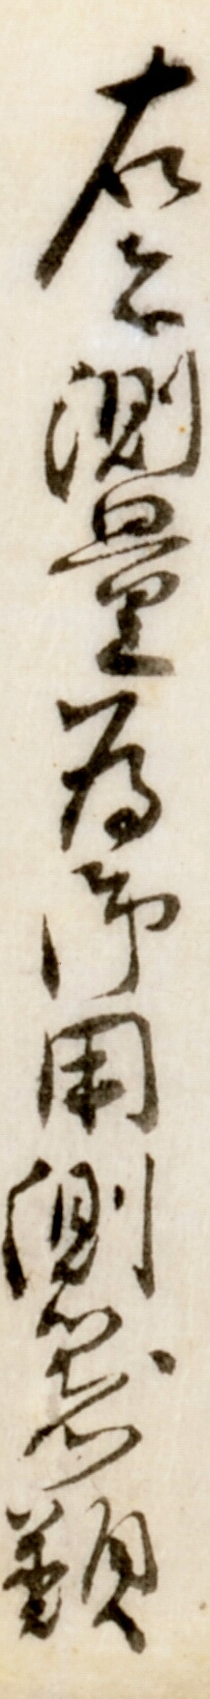右者測量為御用測器類
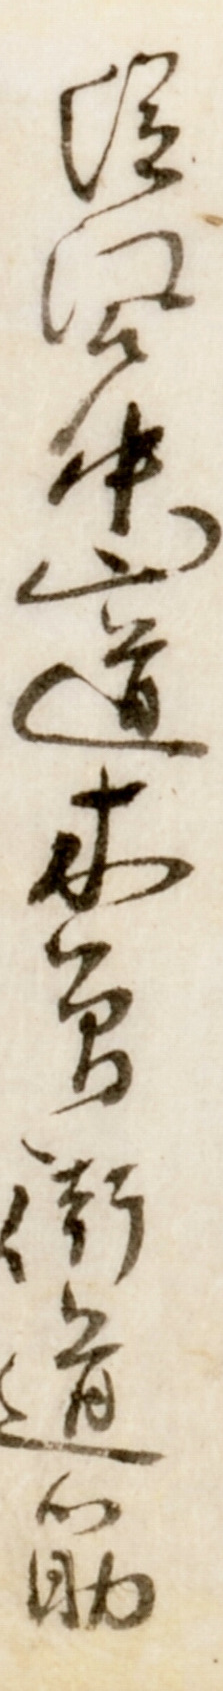従江戸中山道木曽街道筋
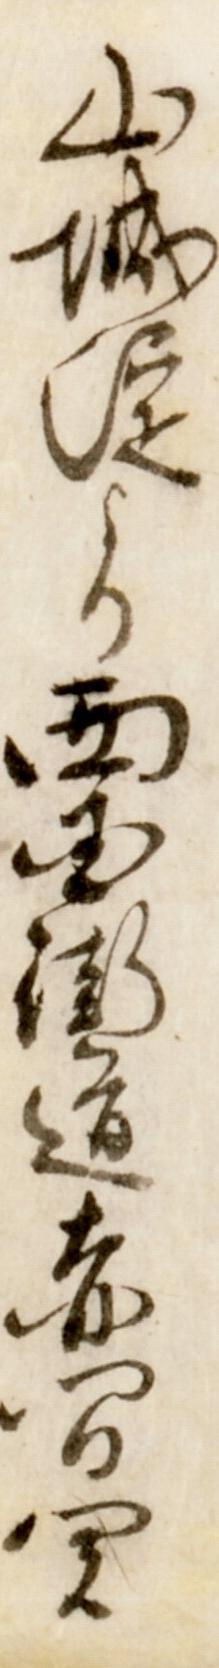山城淀より西国街道赤間関
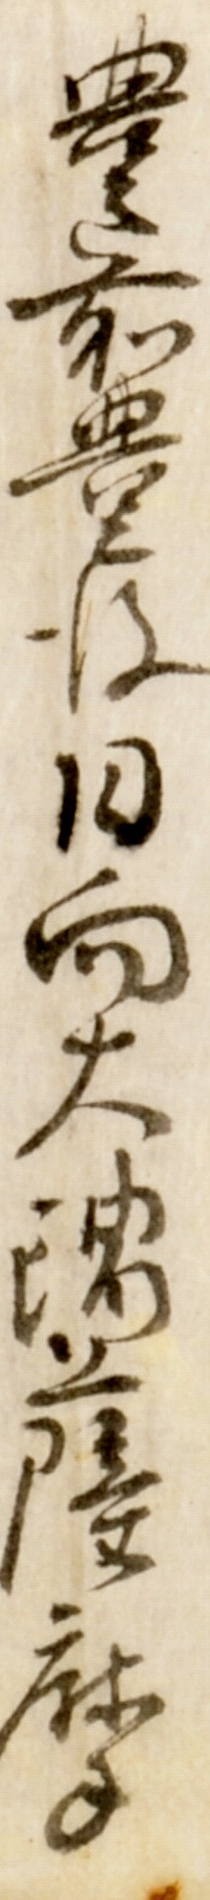豊前豊後日向大隅薩摩
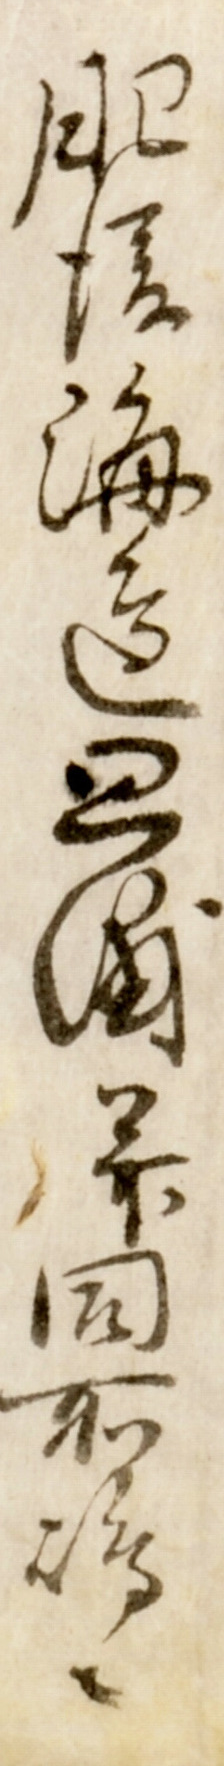肥後海邊廻浦幷同所嶋々
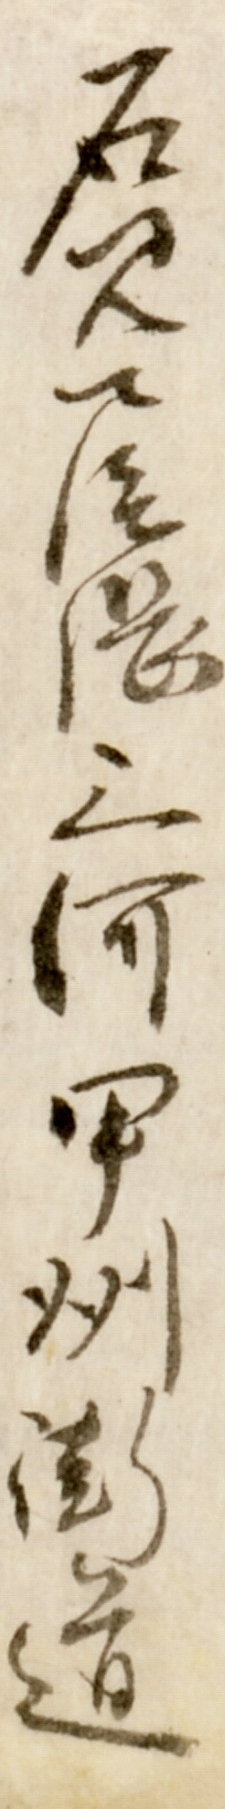石見尾張三河甲州街道
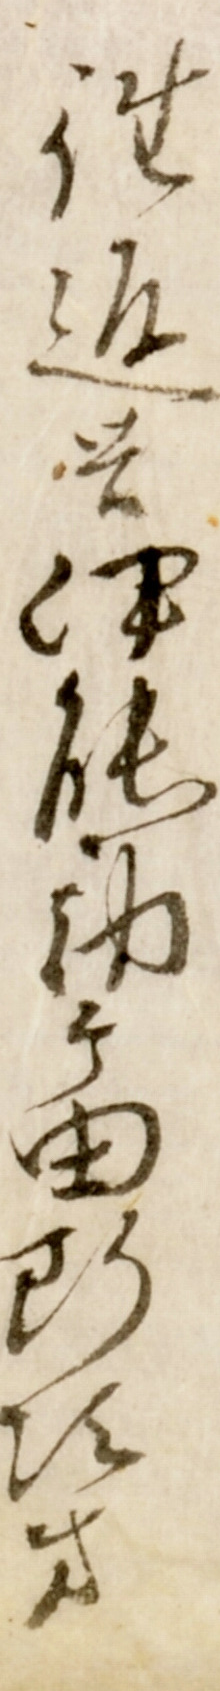往返共伊能勘ヶ由断次第
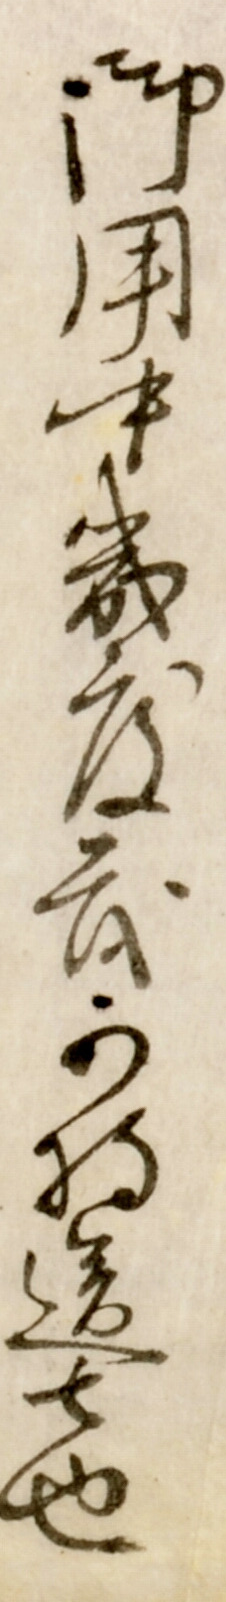御用中幾度茂可持送者也
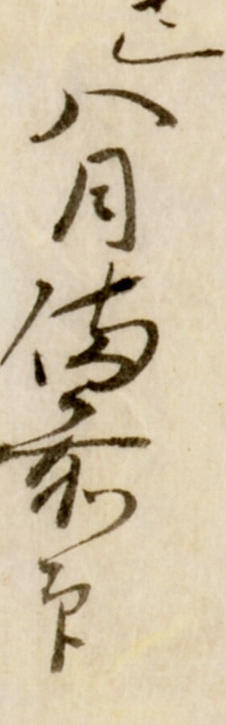巳八月備前印
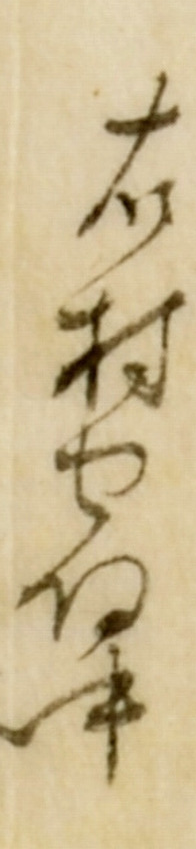右村宿中

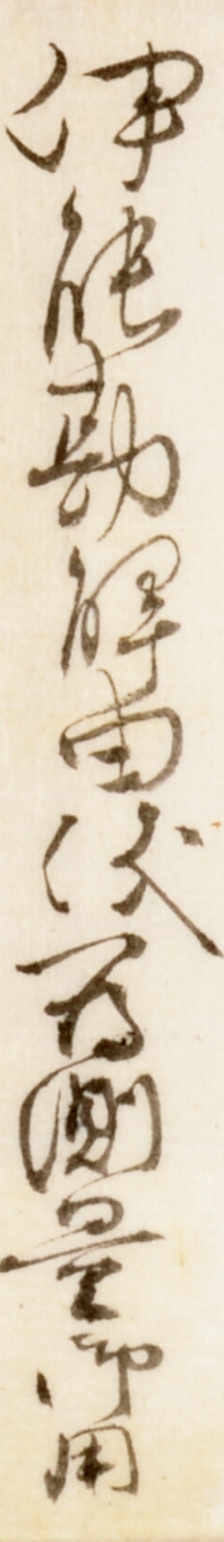伊能勘解由儀測量御用
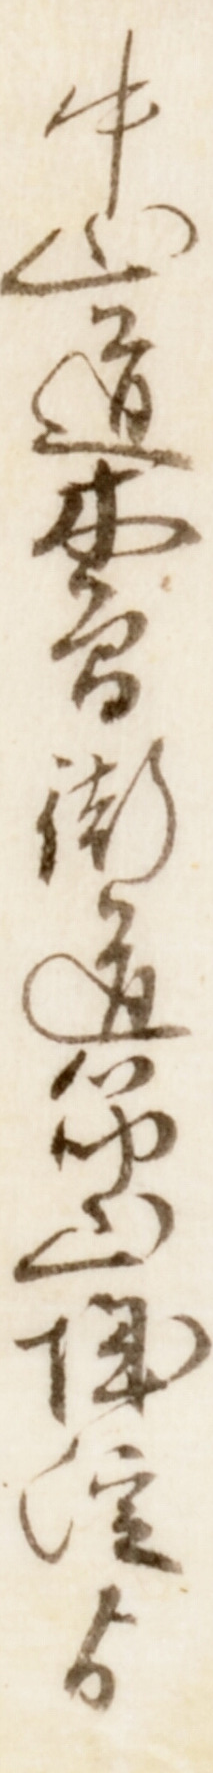中山道木曽街道筋山城陰淀より
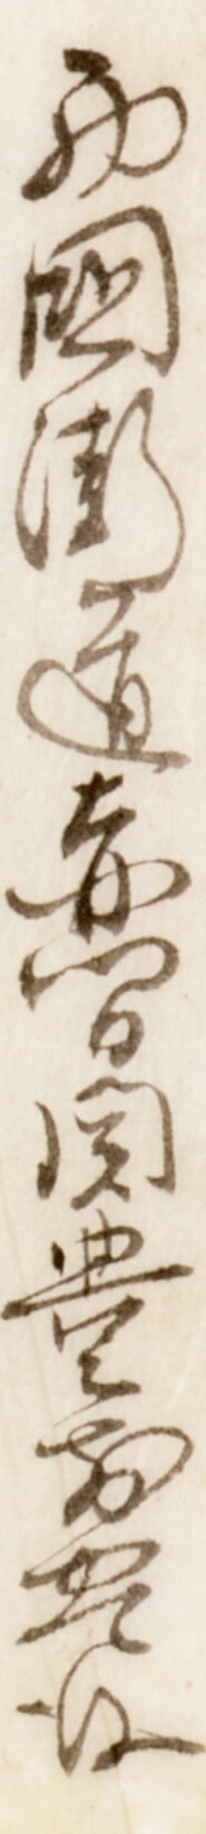西国街道赤間関豊前豊後
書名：人馬先触（控）
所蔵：伊那市立高遠町図書館・合同会社AMANE
